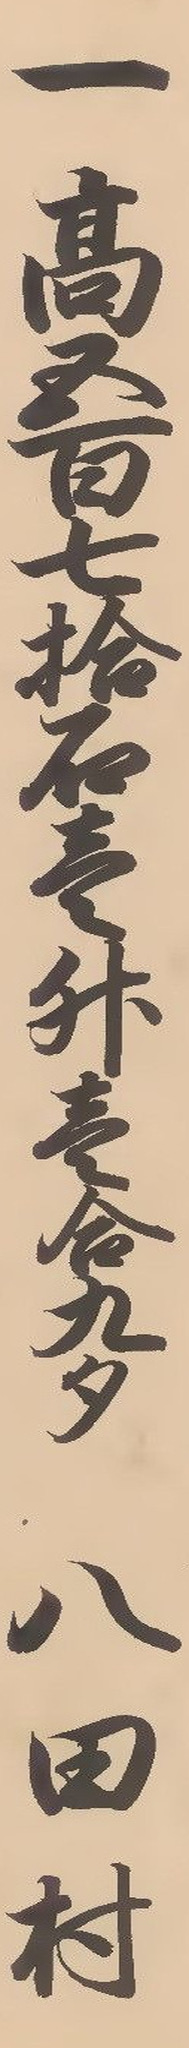一高五百七拾石壱升壱合九勺八田村
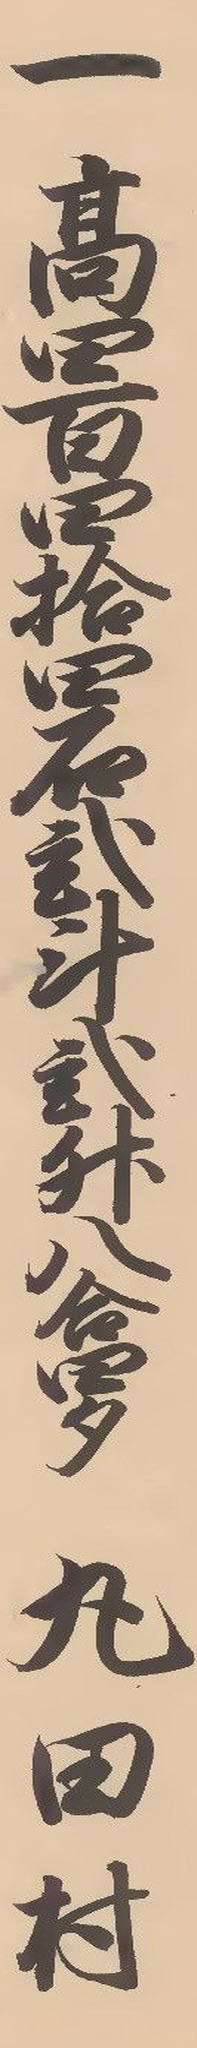一高四百四拾四石弐斗弐升八合四勺丸田村
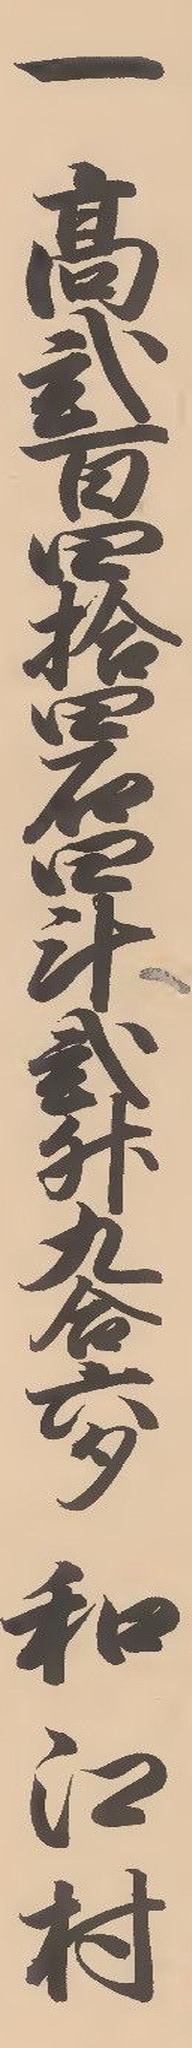一高弐百四拾四石四斗弐升九合六勺和江村
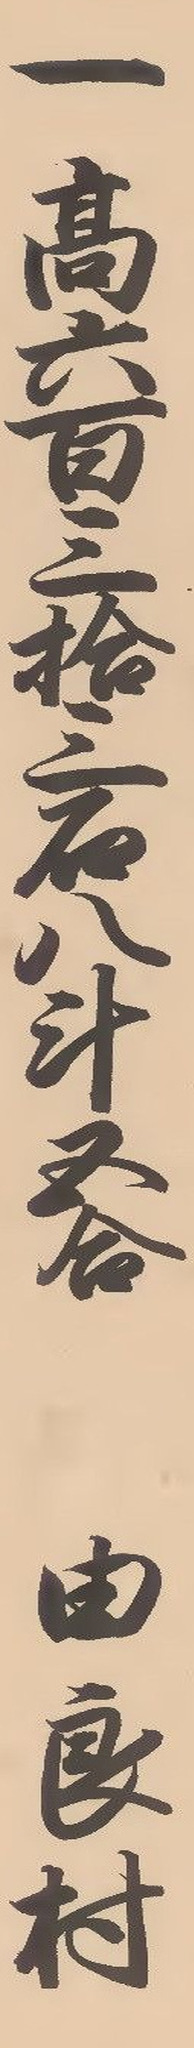一高六百三拾三石八斗五合由良村
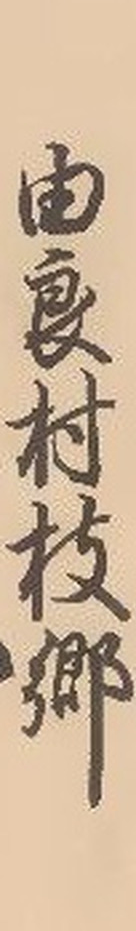由良村枝郷
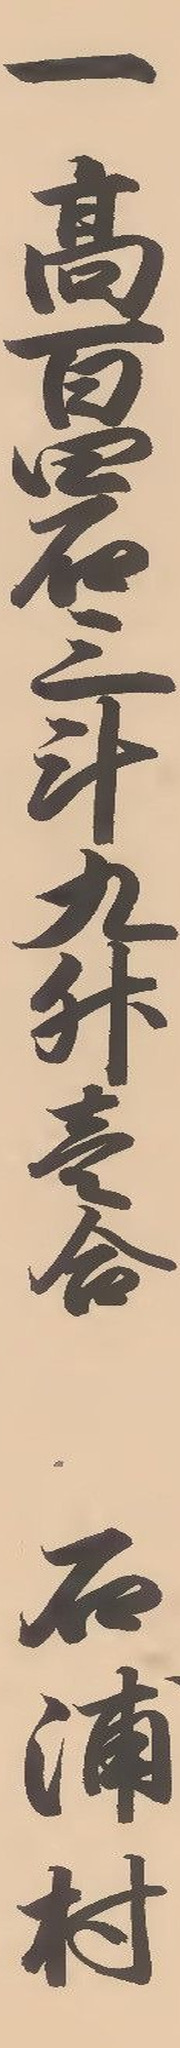一高百四石三斗九升壱合石浦村
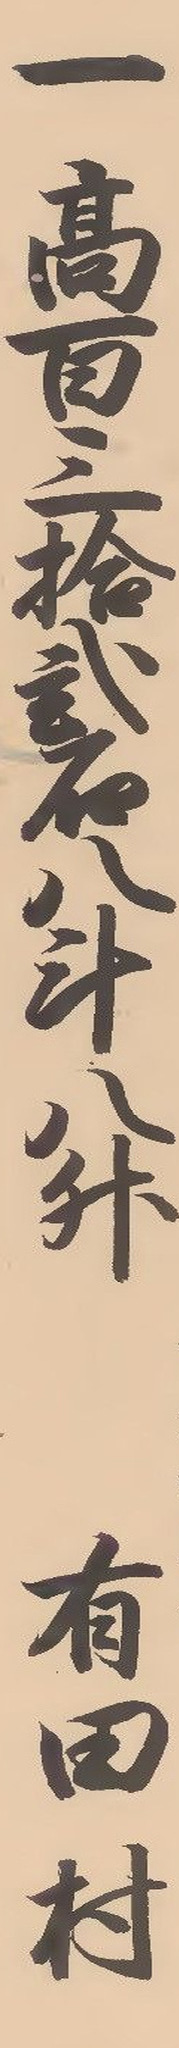一高百三拾弐石八斗八升有田村

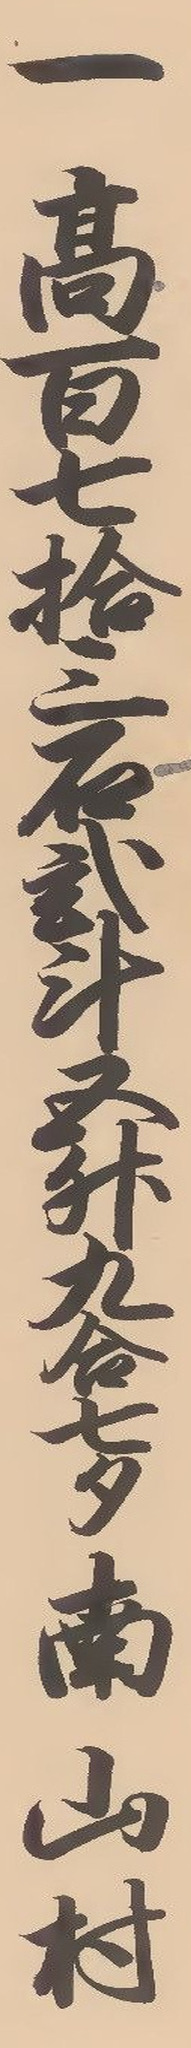一高百七拾三石弐斗五升九合七勺南山村
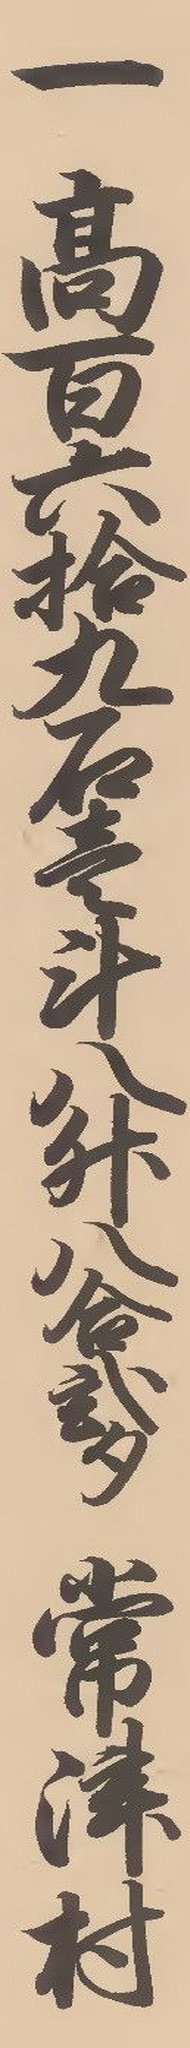一高百六拾九石壱斗八升八合弐勺常津村
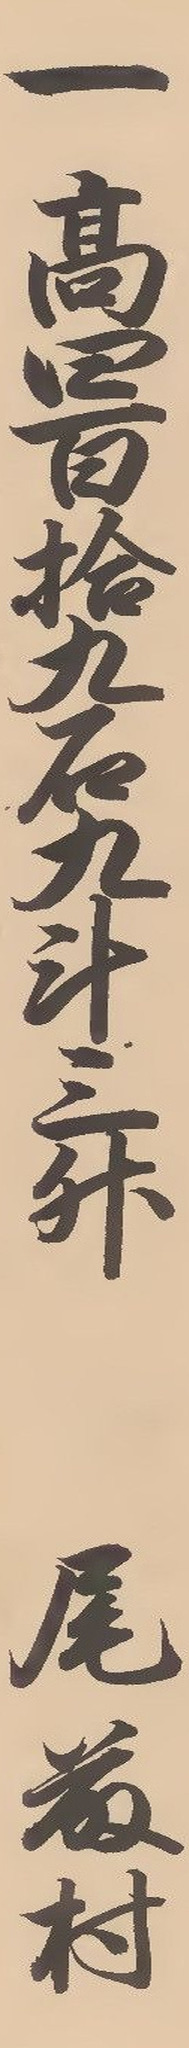一高四百拾九石九斗三升尾藤村
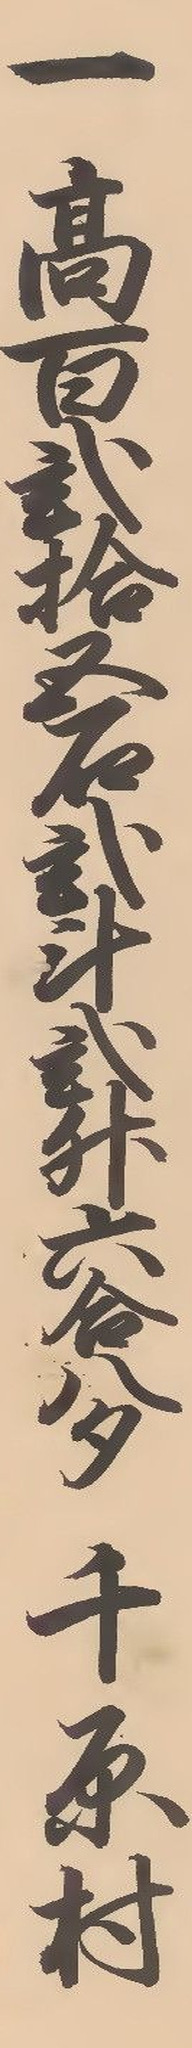一高百弐拾五石弐斗弐升六合八勺千原村
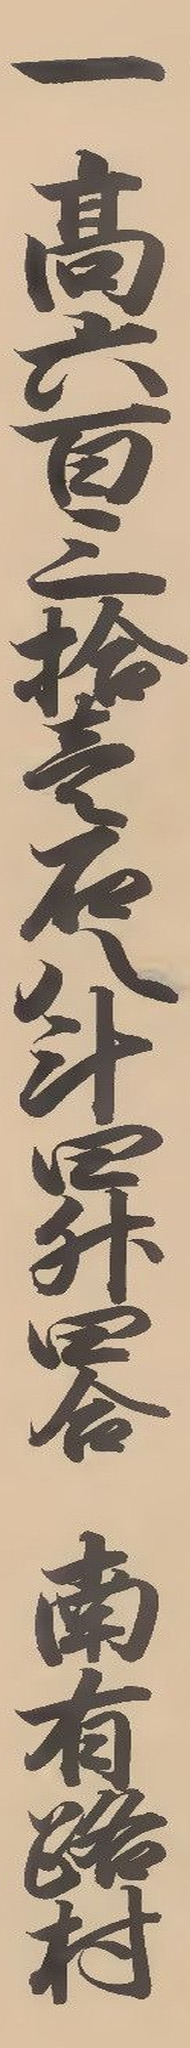一高六百三拾壱石八斗四升四合南有路村
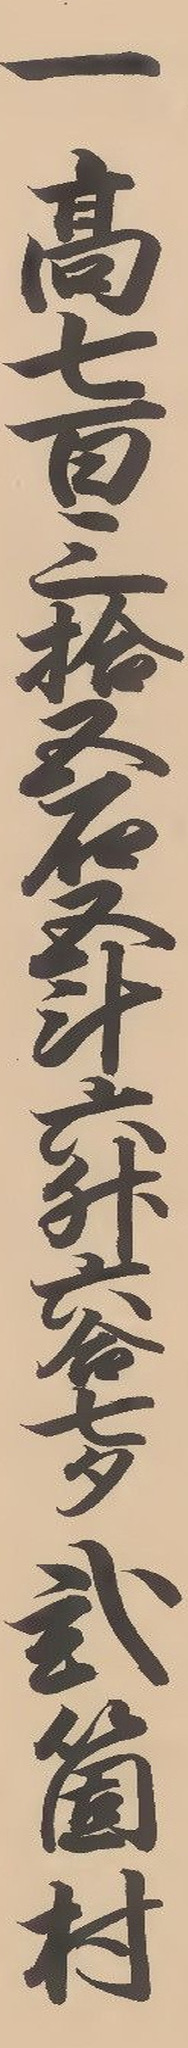一高七百三拾五石五斗六升六合七勺弐箇村
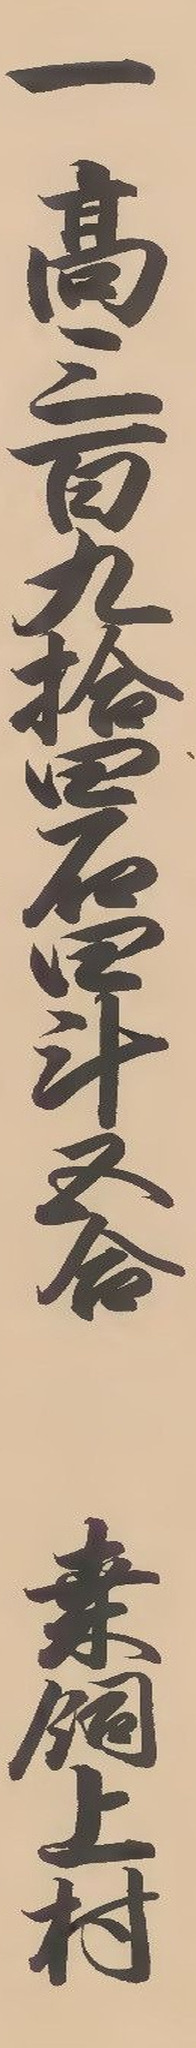一高三百九拾四石四斗五合桑飼上村
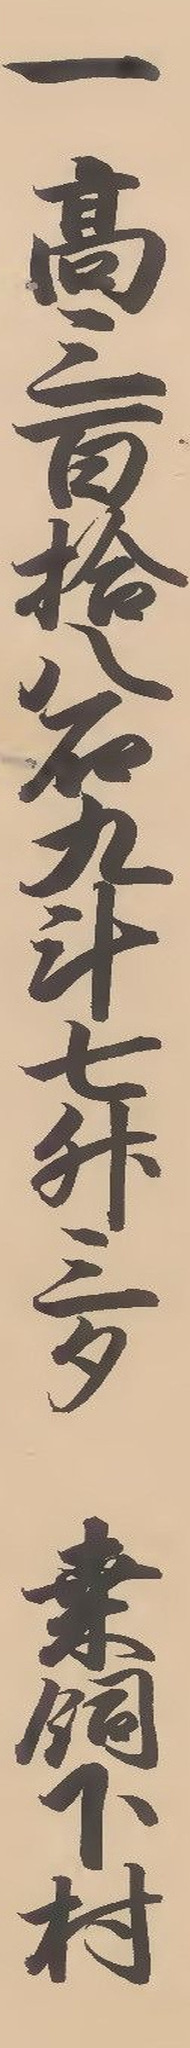一高三百拾八石九斗七升三勺桑飼下村

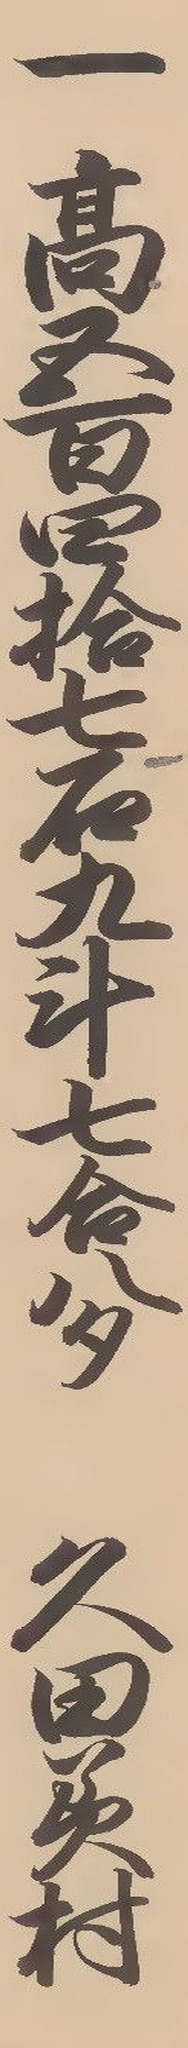一高五百四拾七石九斗七合八勺久田美村
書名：丹後国郷帳
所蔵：国立公文書館 National Archives of Japan
